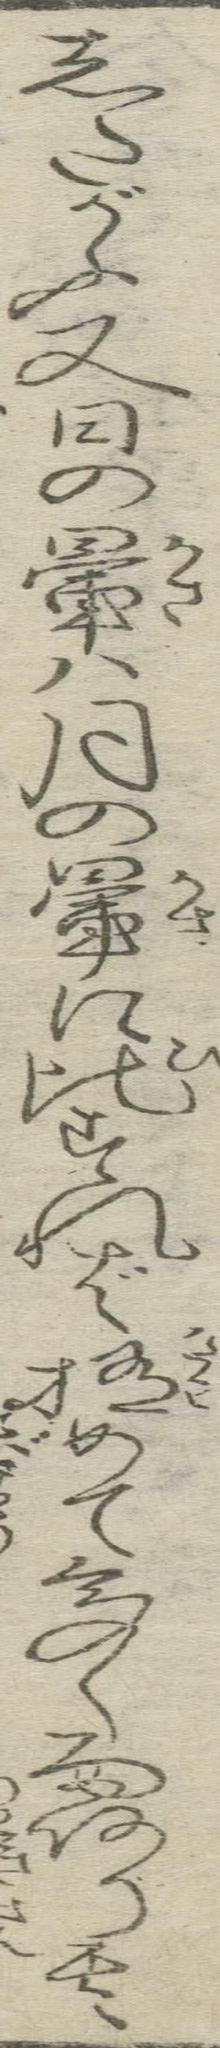したがふ又日の暈は月の暈に比すれば極めて多く雨あり其
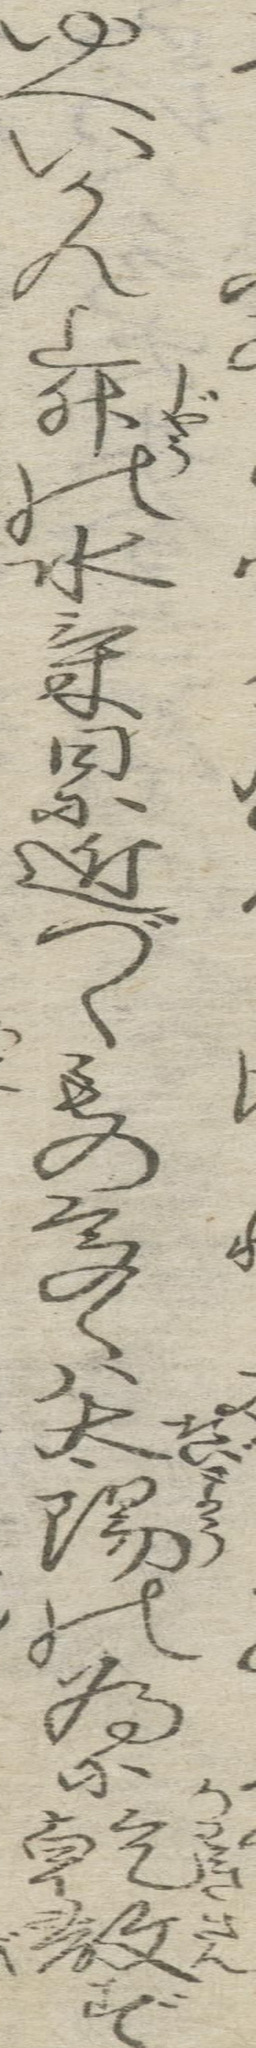ゆへいかん上升の水気日に近づくもの多くは太陽の為に乾散ず
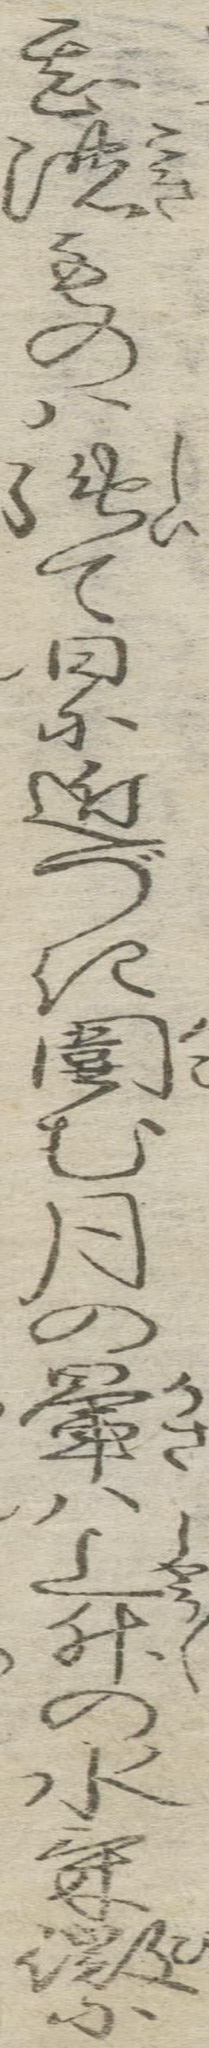甚濃ものは強て日に近づき囲む月の暈は上升の水気微に
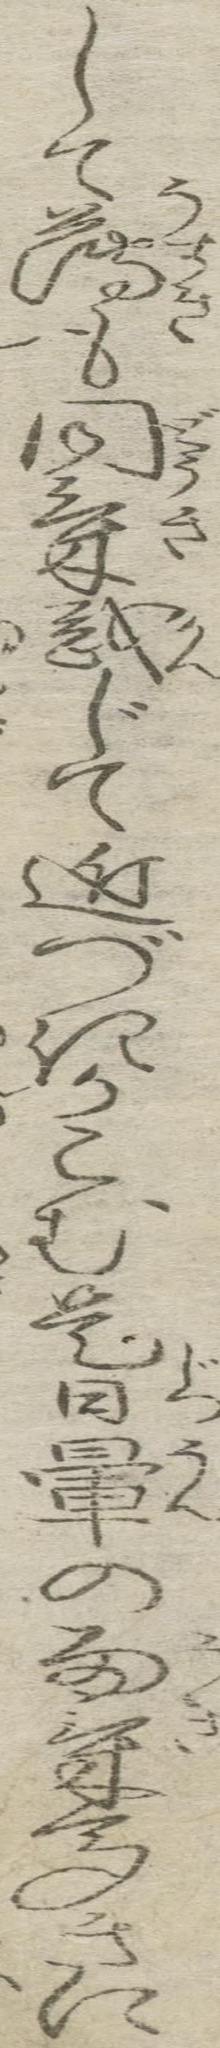して薄も同気感じて近づきかこむ是日暈の雨気多きに
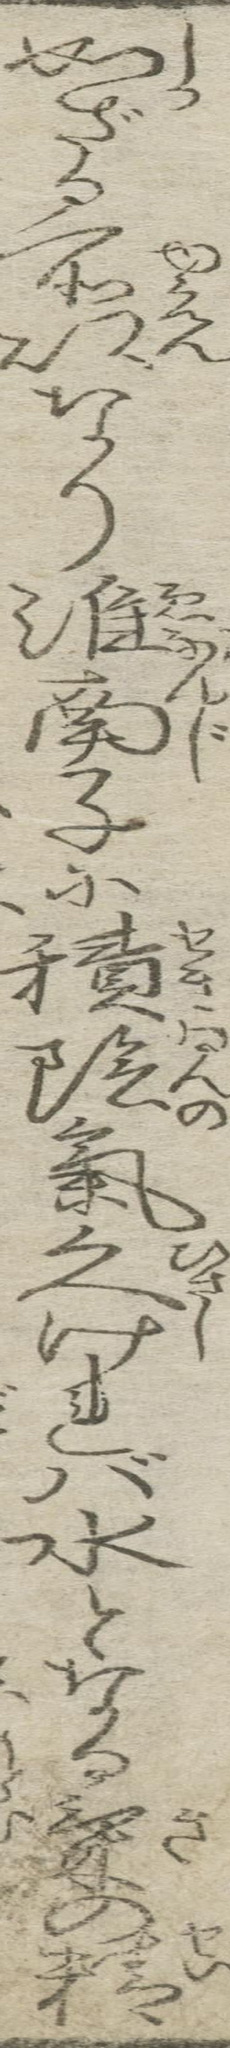如ざる所以なり淮南子に積陰気久ければ水となる気の精
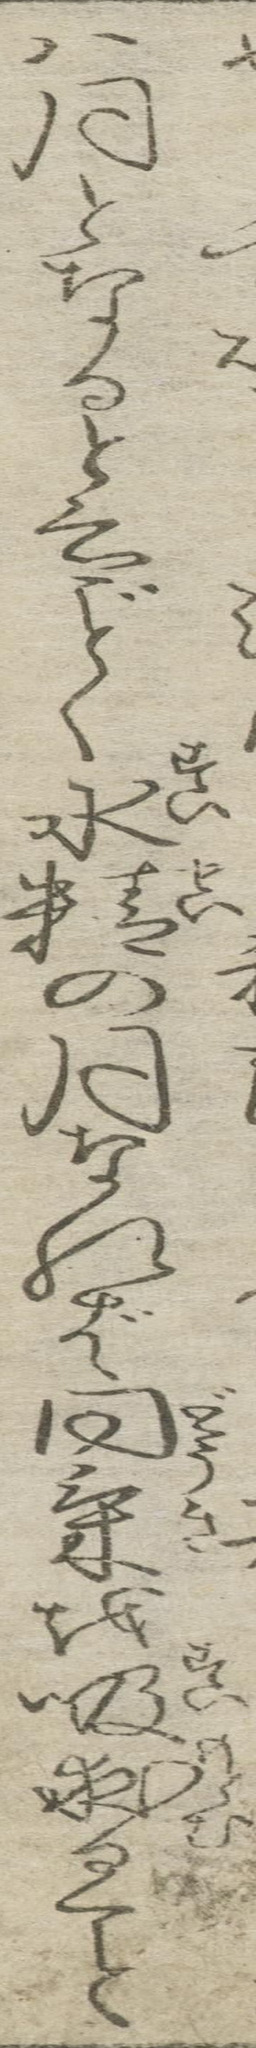は月となると云ごとく水精の月なれば同気を吸求ること
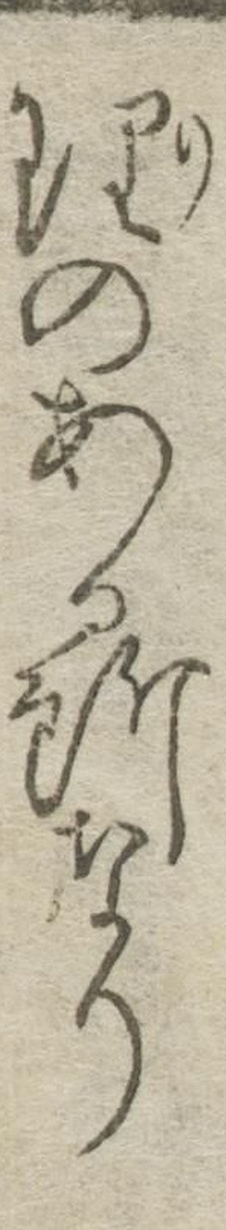理のある所なり

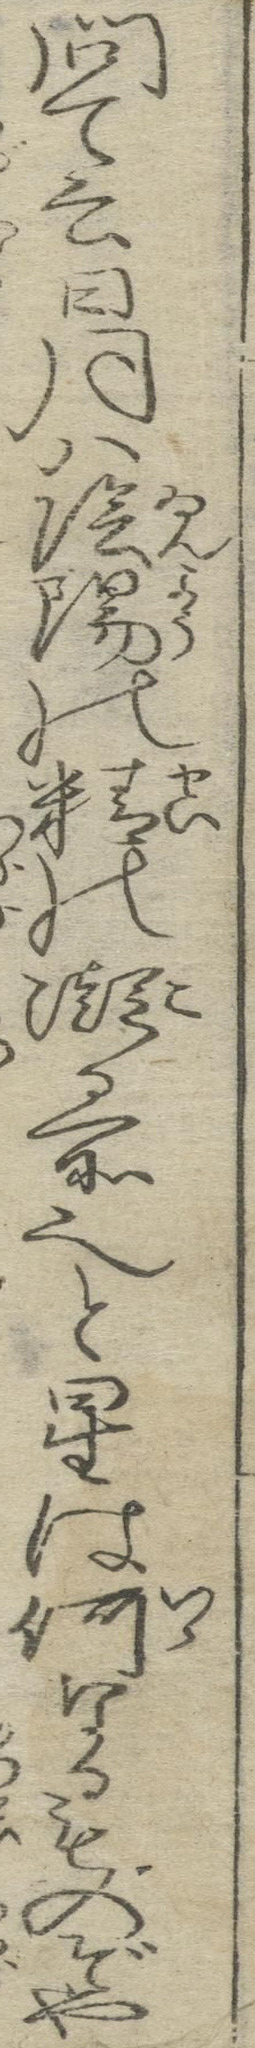問て云日月は陰陽の精の凝る所也と星は何なるものぞや
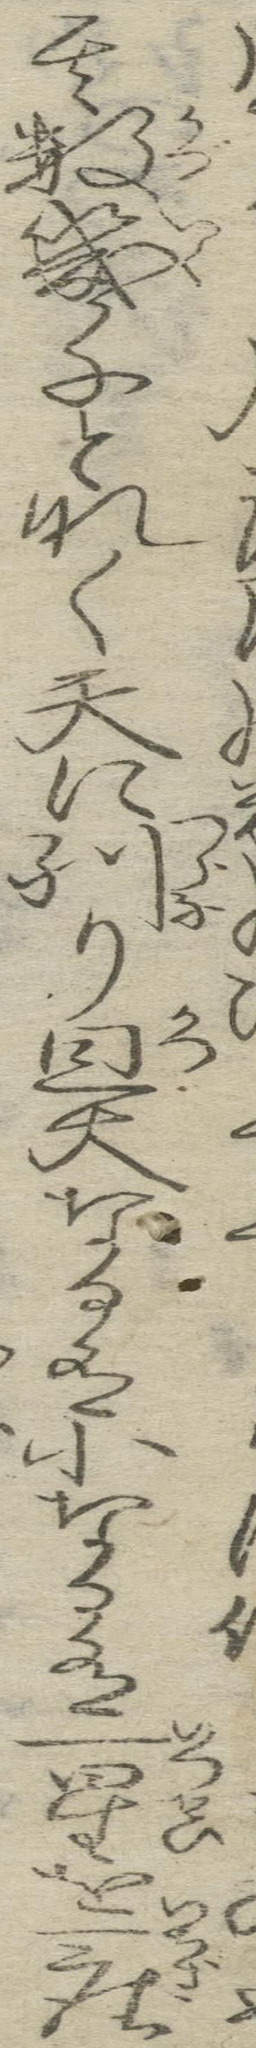其数幾千となく天に列り且大なる有小なる有一星を一座
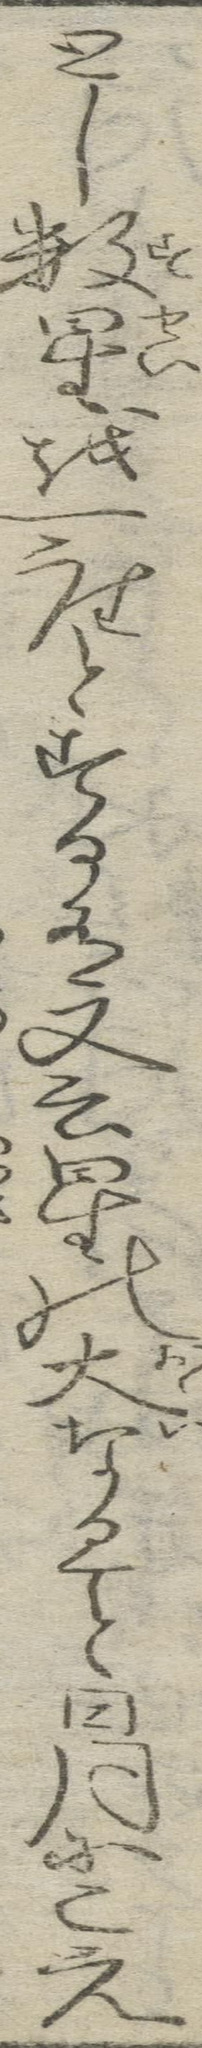とし数星を一座とする有又云星の大なること日月にこえ
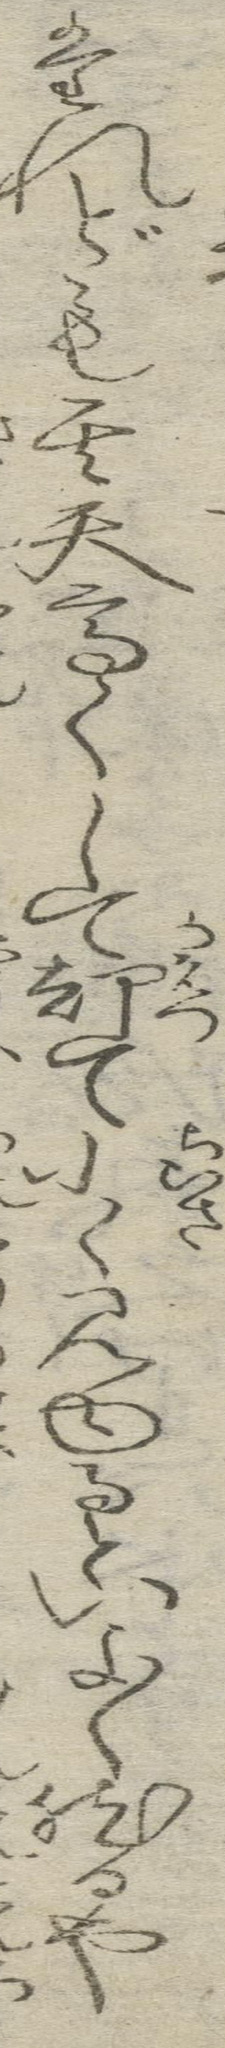たれども其天高くして却て小見ゆるといよ〳〵然るや
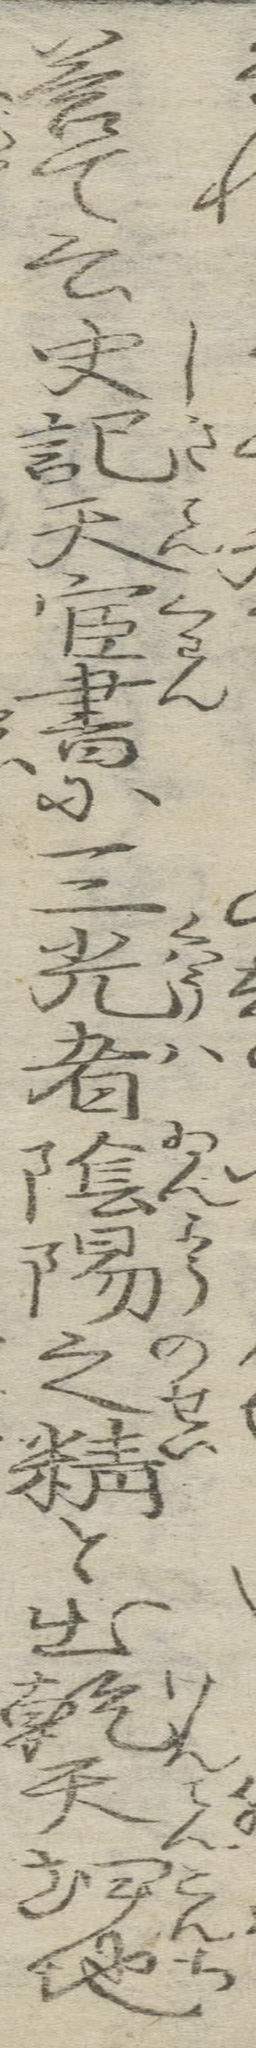答て云史記天宦書に三光者陰陽之精と出乾天坤地
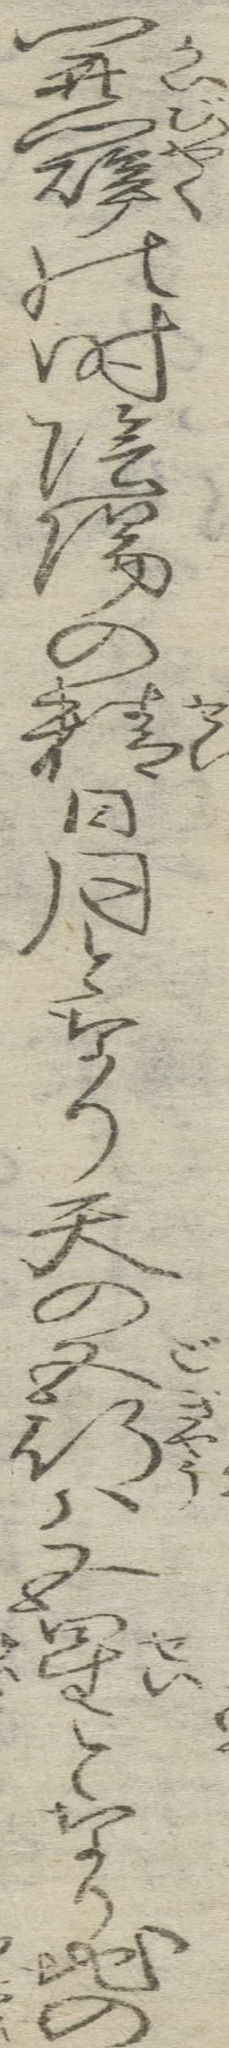開闢の時陰陽の精日月となり天の五行は五星となり地の
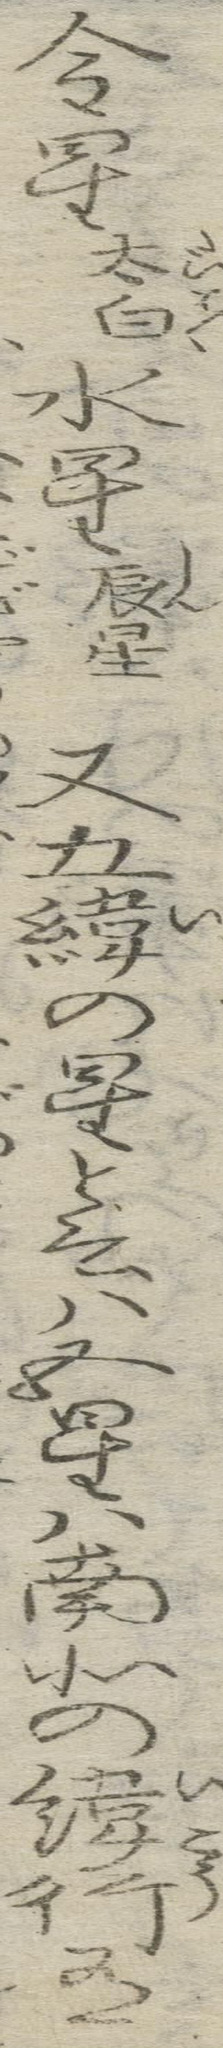金星太白水星辰星又五緯の星と云は五星は南北の緯行有
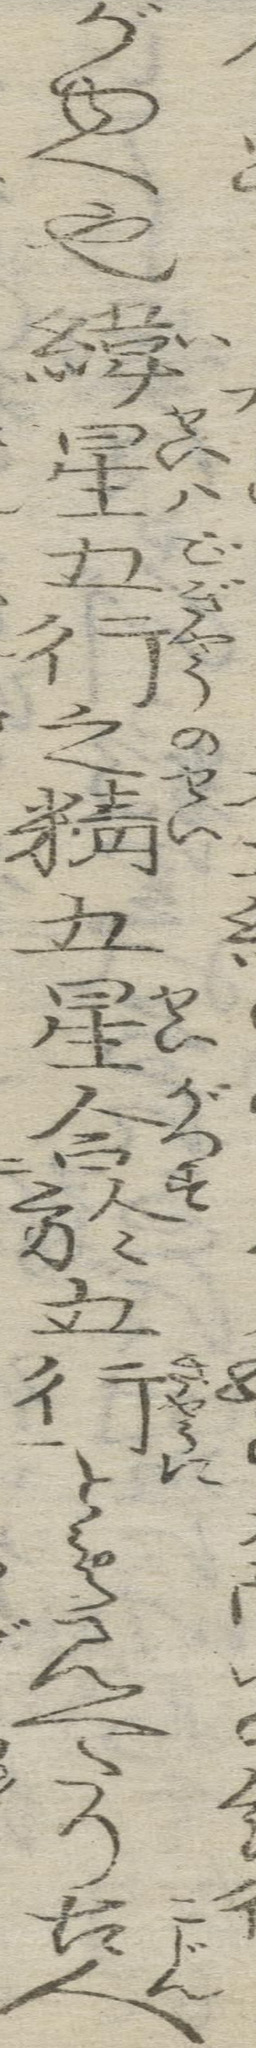がゆへ也緯星五行之精五星合於五行とも見へたり古人
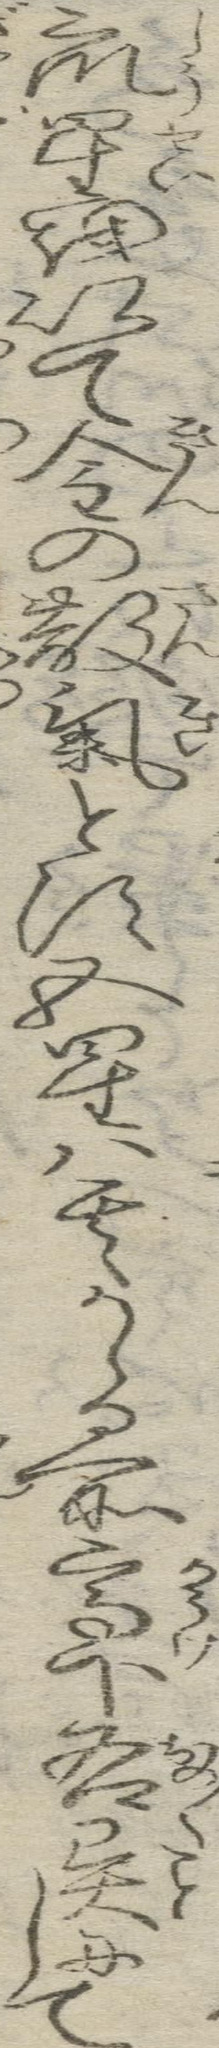衆星を以て金の散気とす五星は其かゝる所高下各異にして
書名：訓蒙天地辨　天
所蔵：東京大学地震研究所図書室 Earthquake Research Institute Library, The University of Tokyo, JAPAN
